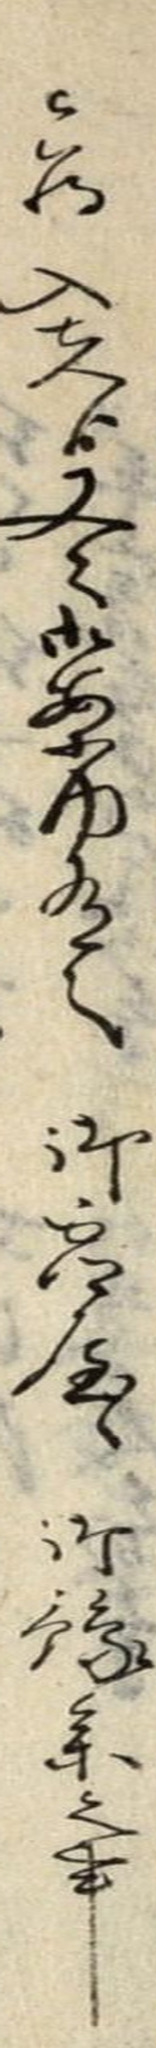被為入夫ゟ又々御案内有之御霊屋へ御予参之事
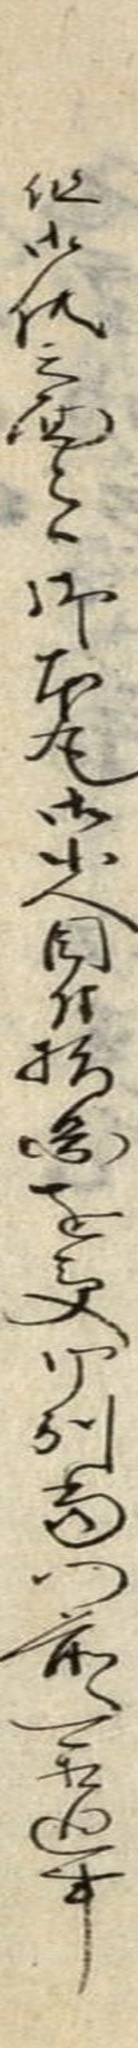但御供之面々は御本丸御小人目付指図を受御別当門前へ可相廻事
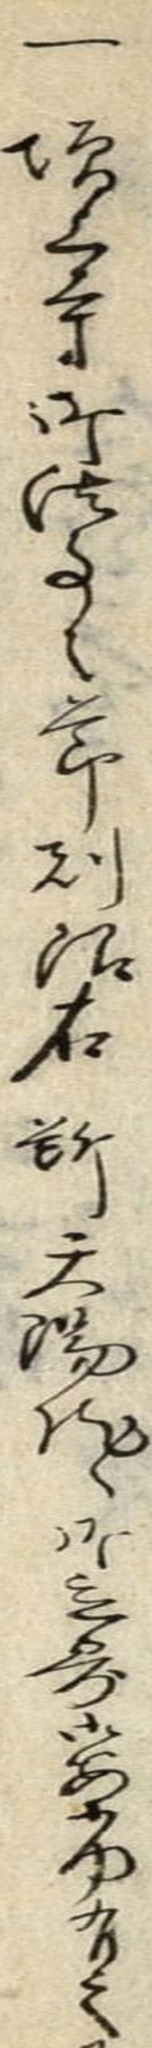一増上寺御法事之節刻限右断天陽院へ御立寄御案内有之本堂へ
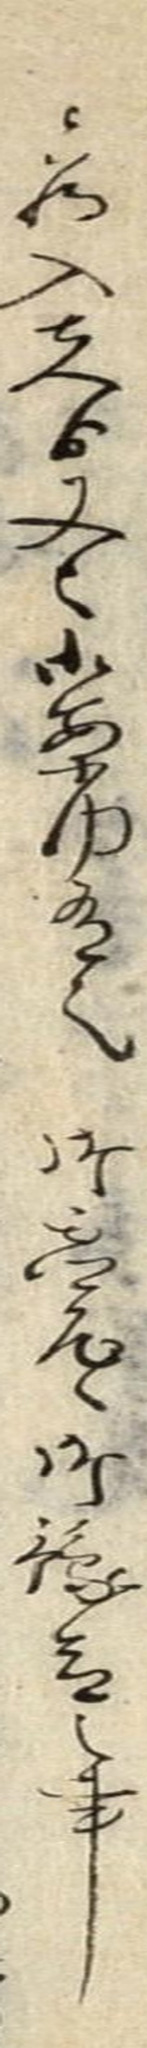被為入夫ゟ又々御案内有之御霊屋へ御予参之事
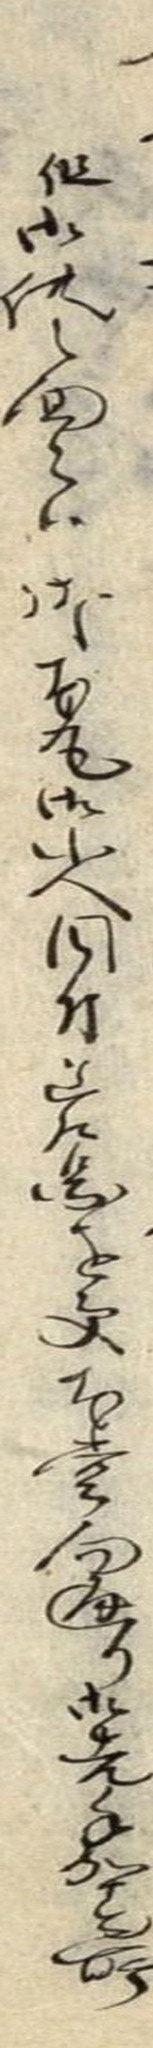但御供之面々は御本丸御小人目付差図を受本堂向通り御先手加番所
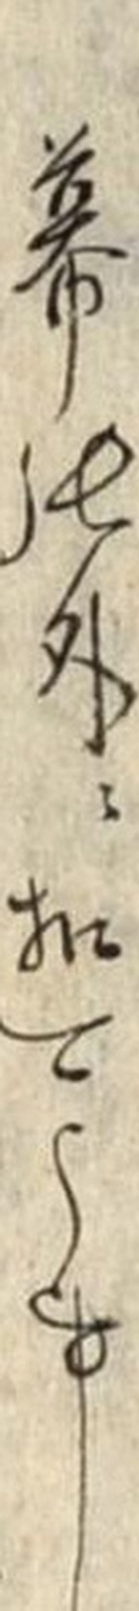幕張外に扣可申事
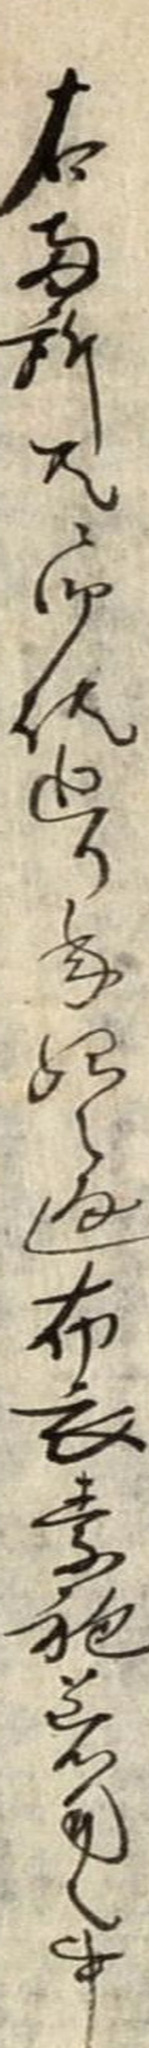右両所共に御供廻り年始之通布衣素袍着用之事
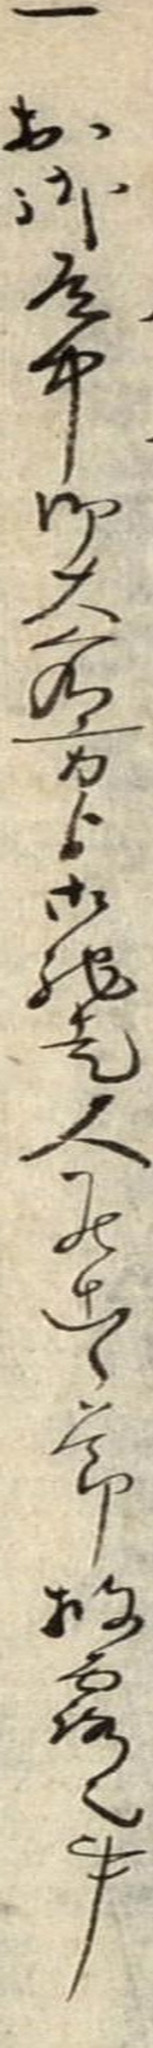一於御道中御大名方ゟ御馳走人罷出候節披露之事
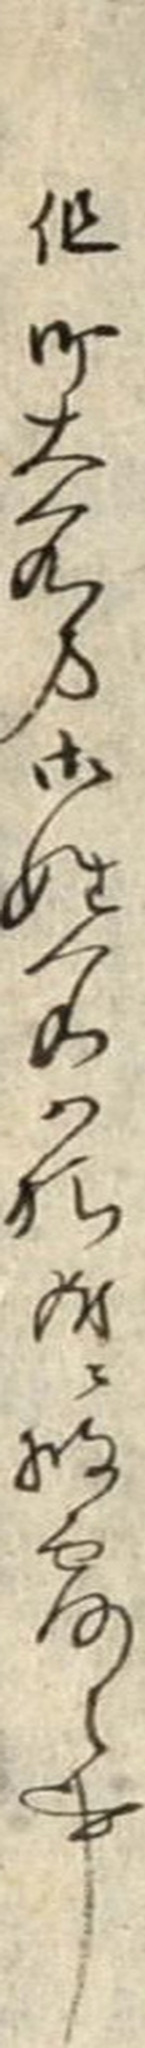但御大名方御姓名は様附に披露之事
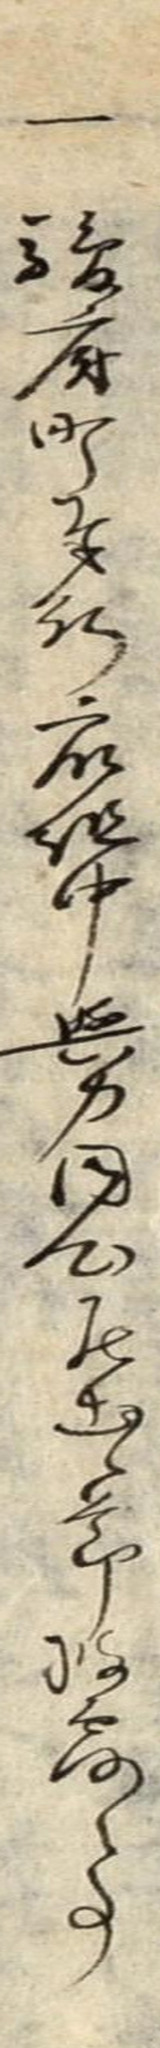一駿府町奉行衆組中与力同心罷出候節披露之事
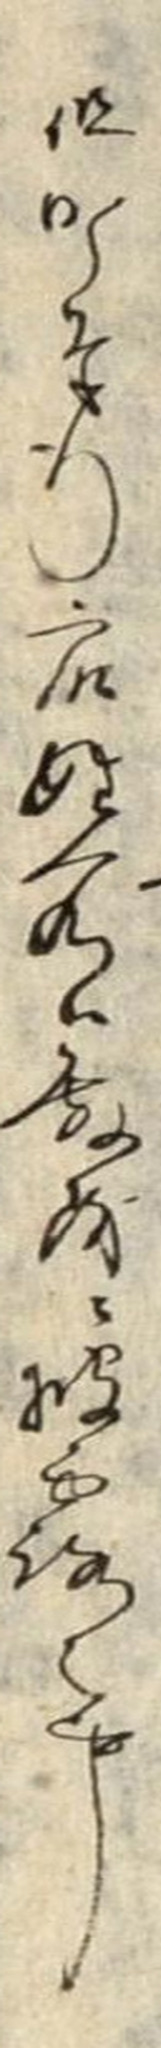但町奉行衆姓名は殿附に披露之事
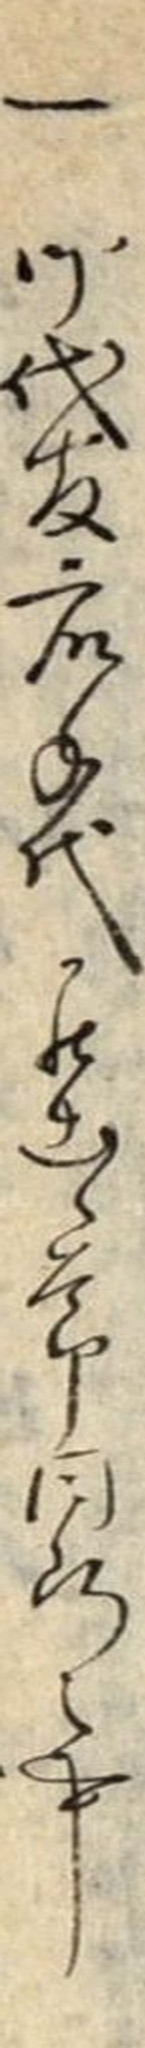一御代官衆手代罷出候節同断之事
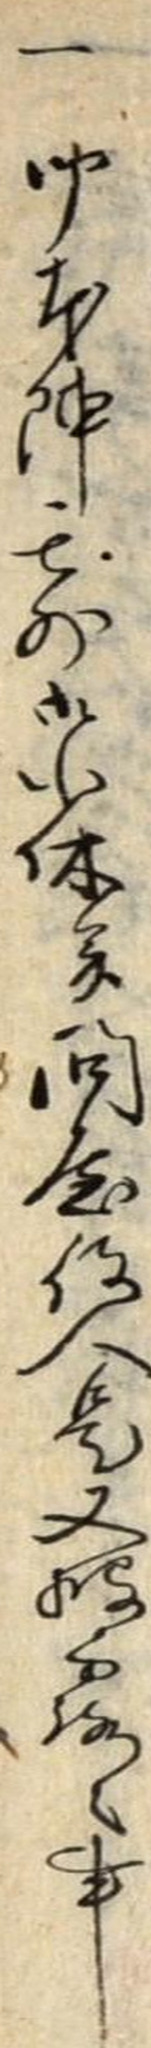一御本陣其外御小休并問屋役人是又披露之事

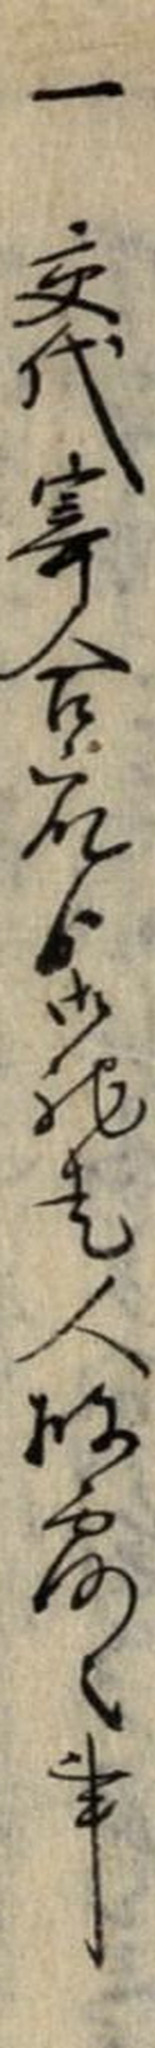一交代寄合衆ゟ御馳走人披露之事
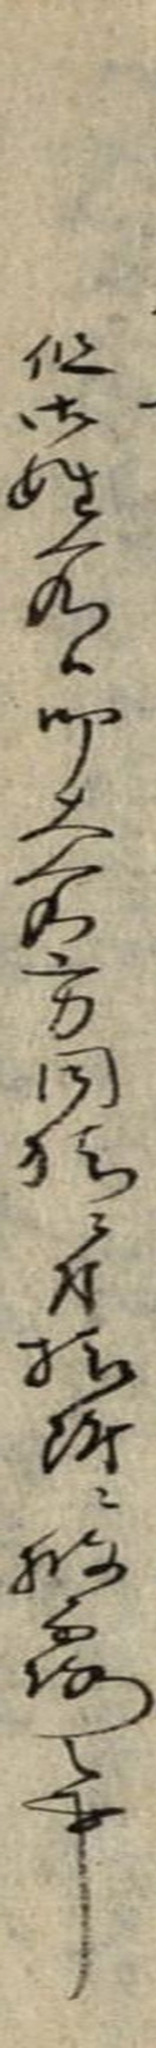但御姓名は御大名方同様に付様附に披露之事
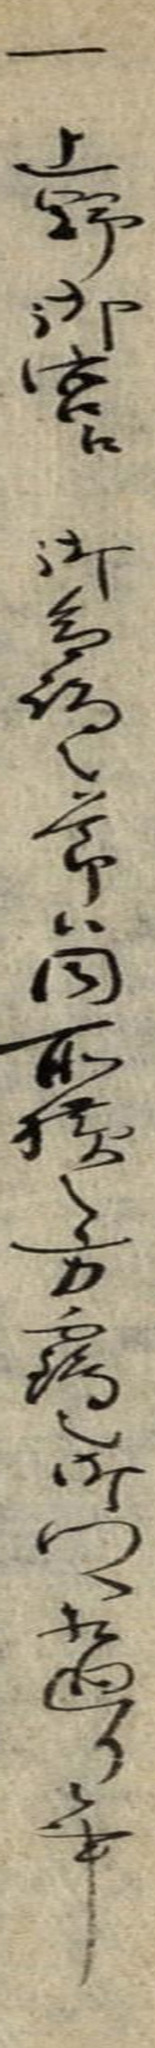一上野御宮江御参詣之節は同所横之方鶴之御門へ相廻り候事
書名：三都并道中之部
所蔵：福井県文書館 Fukui Prefectural Archives
